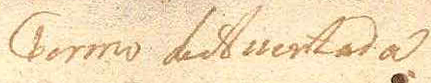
Termo de Assentada
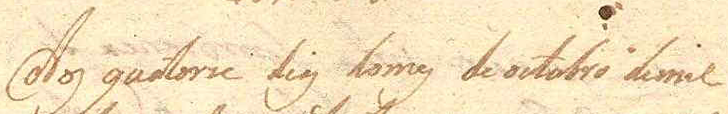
Aos quatorze dias do mes de outubro de mil
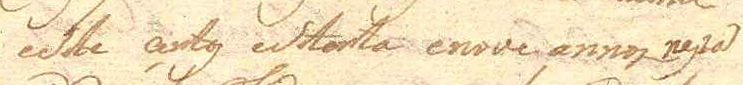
e setecentos e setenta e nove annos nesta
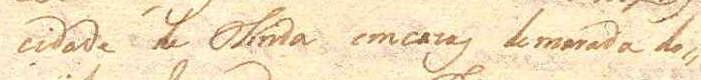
cidade de Olinda em cazas de morada do,
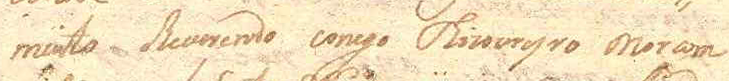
muito Reverendo conego Thizourejro mor com
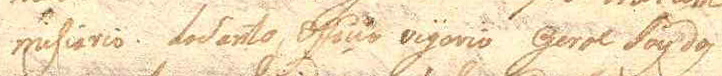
missario. do Santo Officio vigario Geral Iois dos
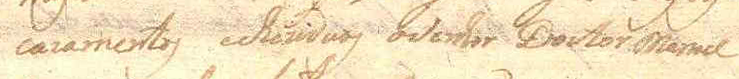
cazamentos e Reziduos o Senhor Doutor Manuel
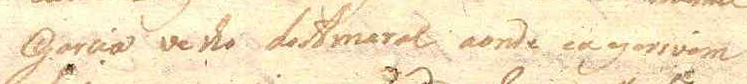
Garcia velho do Amaral aonde eu escrivam
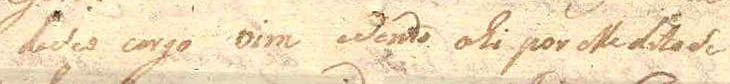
de seo cargo vim e sendo ahi por elle dito se
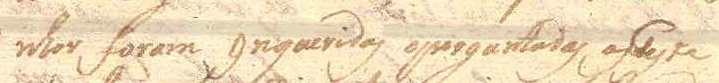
nhor foram Jnqueridas e perguntadas as teste
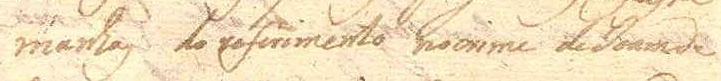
munhas do referimento no crime de Ioam de
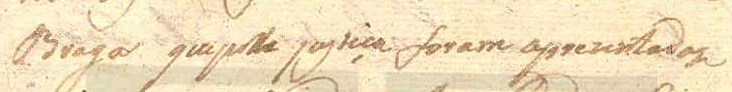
Braga que pella justiça foram aprezentadas
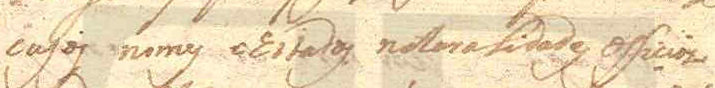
cujos nomes e Estados naturalidades officioz
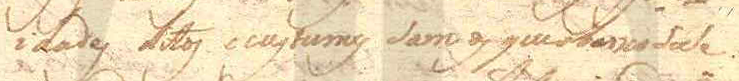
idade ditos e custumes sam os que abaixo se se
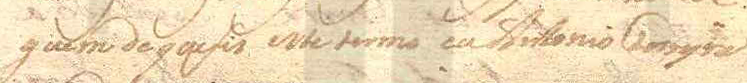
guem de que fis este termo eu Antonio Ferrejra
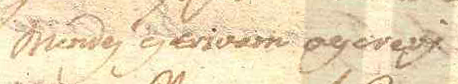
Mendes escrivam o escrevj
